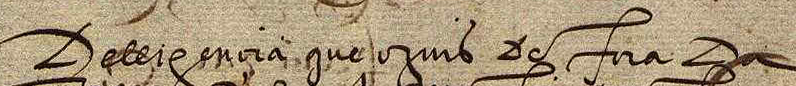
Delligençia que o Juis De fora Da
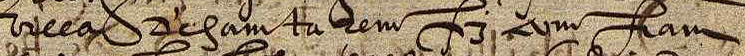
villa De samtarem fez com fram
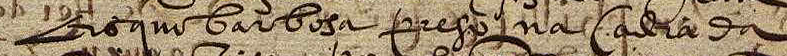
Cisquo barbosa preso na Cadeia da
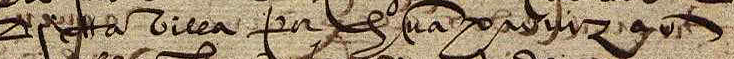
Djctta villa por huā prouizaõ
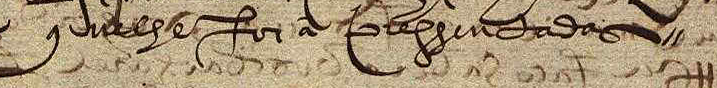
que lhe foi apressentadas //
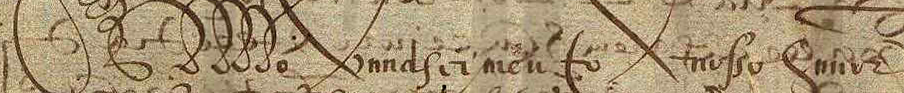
ANNo do nnascimento de nosso Snnor̄
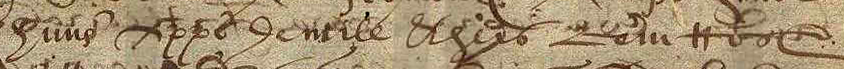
Jhuus̄ xppo de mill & seisCemttos e
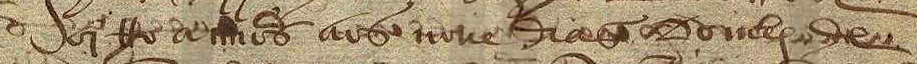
ojtto annos aos noue dias Do mes de
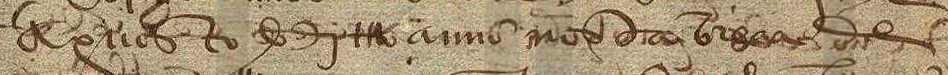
aguosto do djtto anno nesta villa de
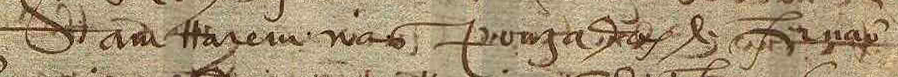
Samttarem nas pouzadas de fernaõ
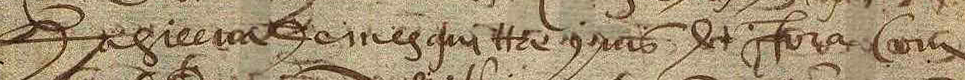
da sillua de mesquitta juis de fora Com
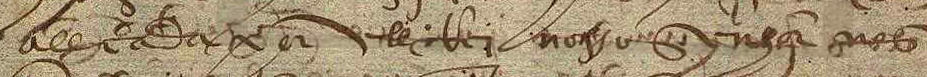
allçada por ell Rej nosso senhor nes
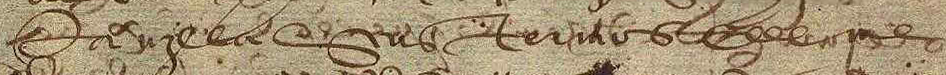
ta ujlla e seus termos elle me
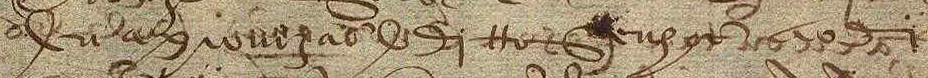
deu a prouizaõ do djtto senhor ao di
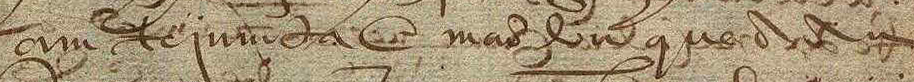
amte jumta e maõdou que AAu
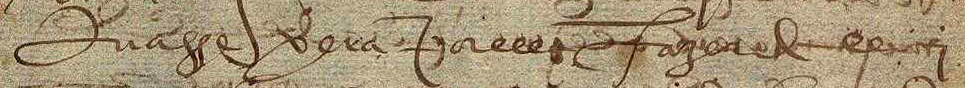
tuasse pera por elle fazer dell_j
